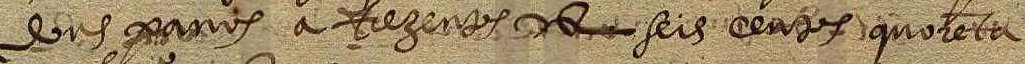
dous panos a trezentos rs seiscentos quorēta
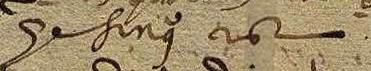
he sinqo rs
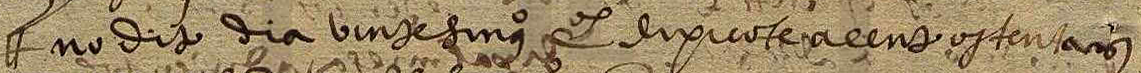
item no dito dia vinte sinqo cos de picote a cento ojtenta rs
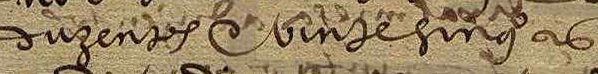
duzentos e vinte sinqo rs
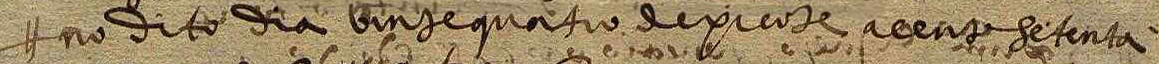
item no dito dia vinte quatro de picote a cento setenta
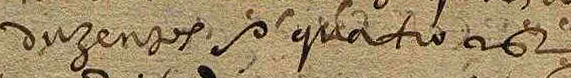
duzentos e quatro rs
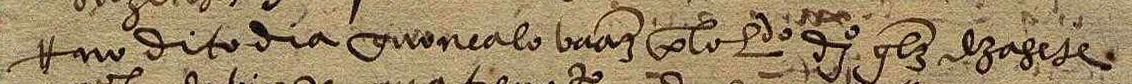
item no dito dia guonçalo vaāz p̄lo Ldo djo gl̄z dezasete
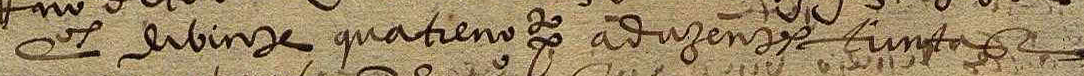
Cos de vinte quatreno pto a duzentos trinta rs
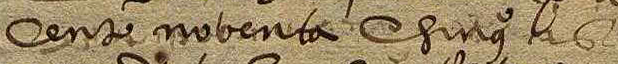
Cento noventa e sinqo rs
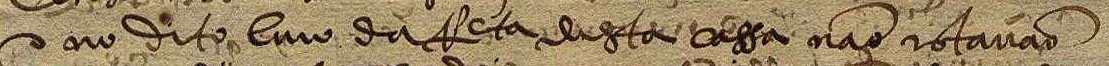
e no dito liuro da Rcta desta cassa não estauaõ
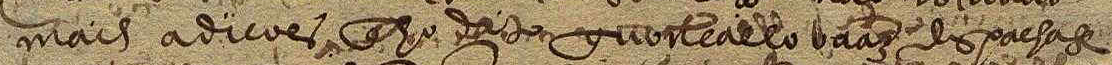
mais adiçoes q̄ ho dito guonçallo vaaz̄ despachase
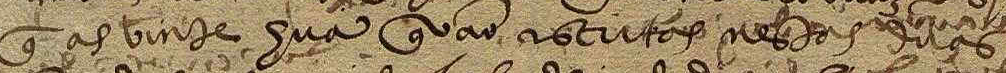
q̄ as vinte hua q̄ vão escritas nestas duas
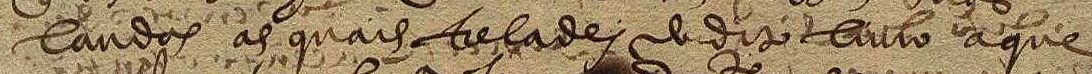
laudas as quais treladej do dito liuro a que
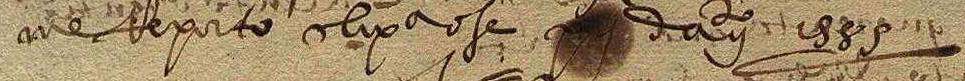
me Reporto ē lixa oJe _ xij dagto 1585
